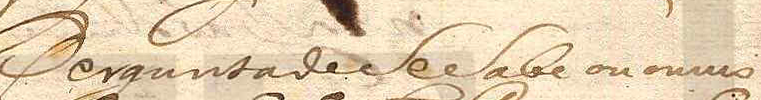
Perguntado Se Sabe ou ouuio
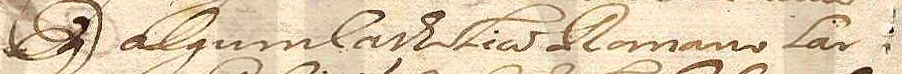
q̄ algum Catholico Romano Lar
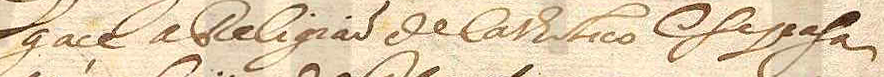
gaçe a Religiaõ de Catholico e se pasa
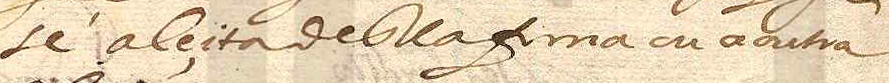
se a Ceita de Mafoma, ou a outra
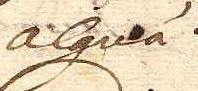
alguā.
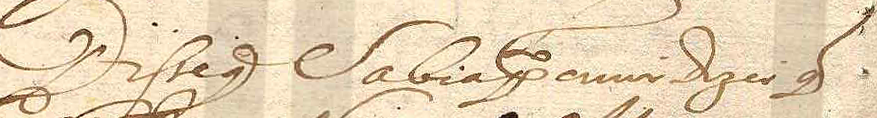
Disse q̄ Sabia pLo ouui dizer q̄
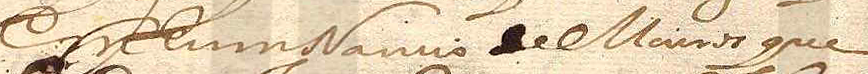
Em hum Nauio de Moiros que
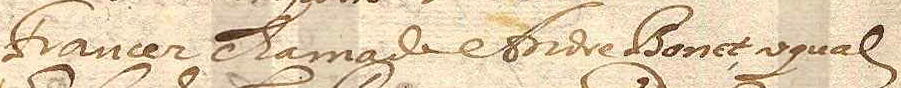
Francez, chamado Andre Bonet, o qual
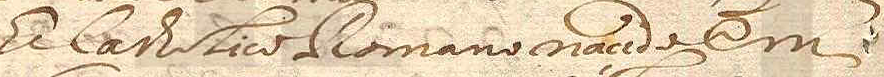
he CathoLico Romano nacido Em
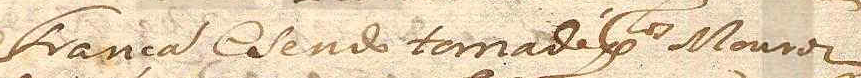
França e sendo tomado pLos Mouros
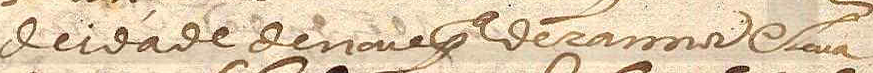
de idade de noue pa dez annos e Leua
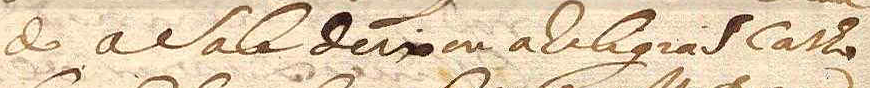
do a Sale deixou a Religiaõ Catho
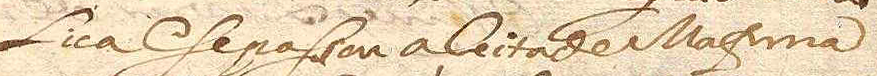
Lica e se passou a Ceita de Mafoma
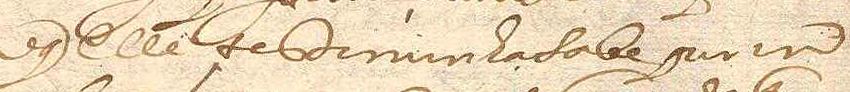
o q̄ elle testemunha sabe por ir
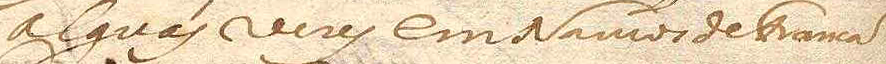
alguās vezes em Nauios de Franca
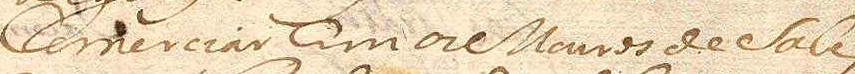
Comerciar Com os Mouros de Sale
